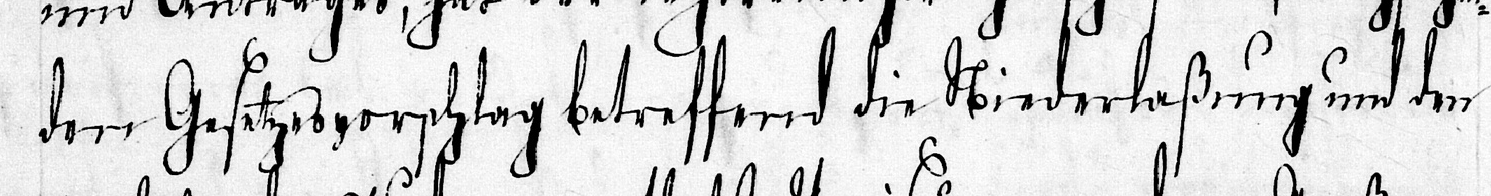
nden Gesetzesvorschlag betreffend die Niederlaßung und den
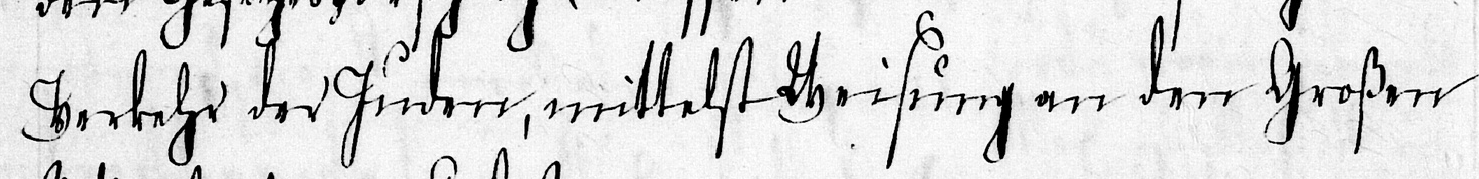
Verkehr der Juden, mittelst Weisung an den Großen
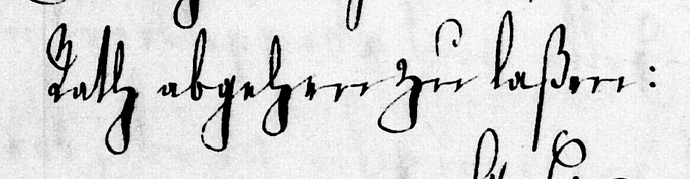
Rath abgehen zu laßen:
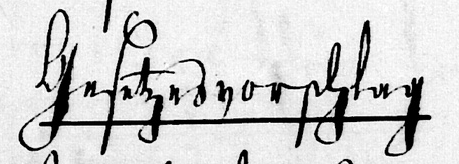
Gesetzesvorschlag
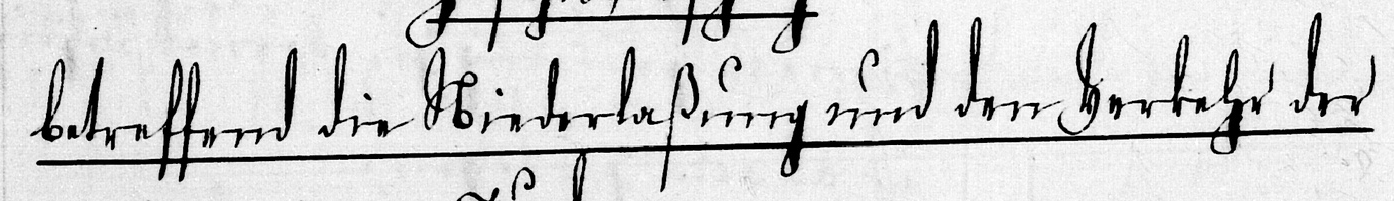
betreffend die Niederlaßung und den Verkehr der
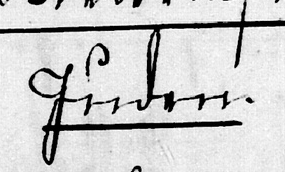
Juden.
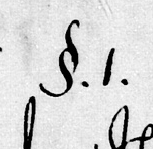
1.
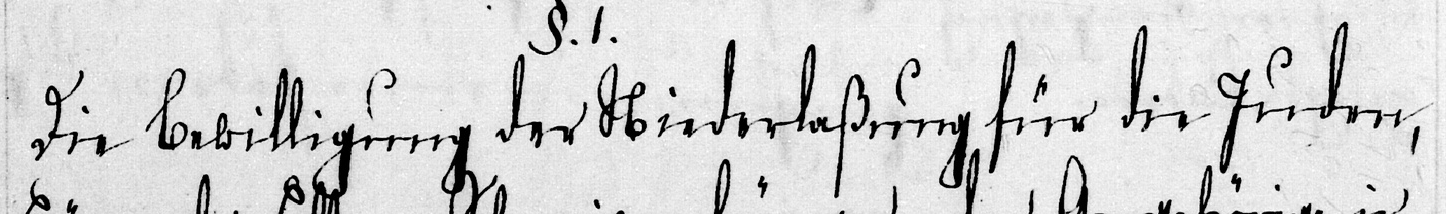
Die Bewilligung der Niederlaßung für die Juden,
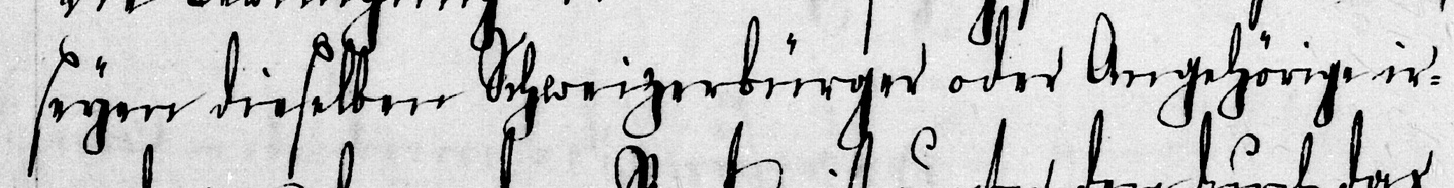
seyen dieselben Schweizerbürger oder Angehörige ir¬
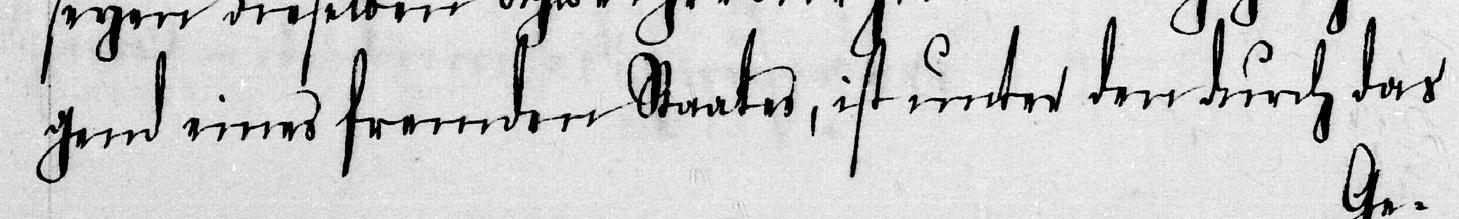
gend eines fremden Staates, ist unter den durch das
